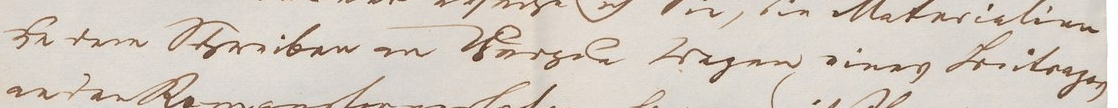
zu dem Schreiben an Thurgau wegen eines Beitrages
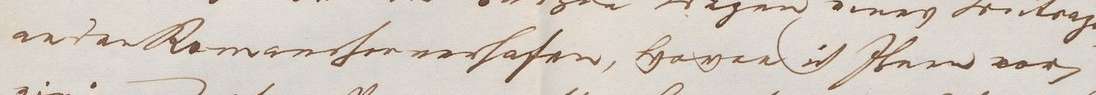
an den Romanshornerhafen, wovon ich Ihnen vor
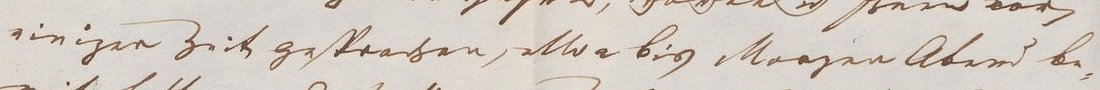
einiger Zeit gesprochen, etwa bis Morgen Abend be-
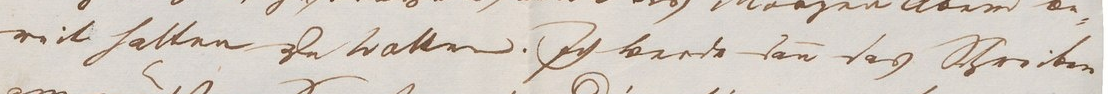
reit halten zu wollen. Ich werde dann das Schreiben
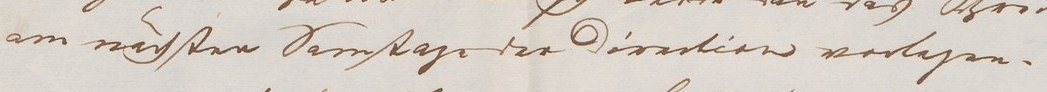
am nächsten Samstag der Direction vorlegen.
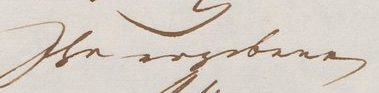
Ihr ergebener
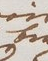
Dr
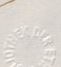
Alfred
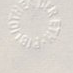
Escher
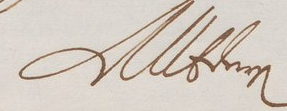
Belvoir.
